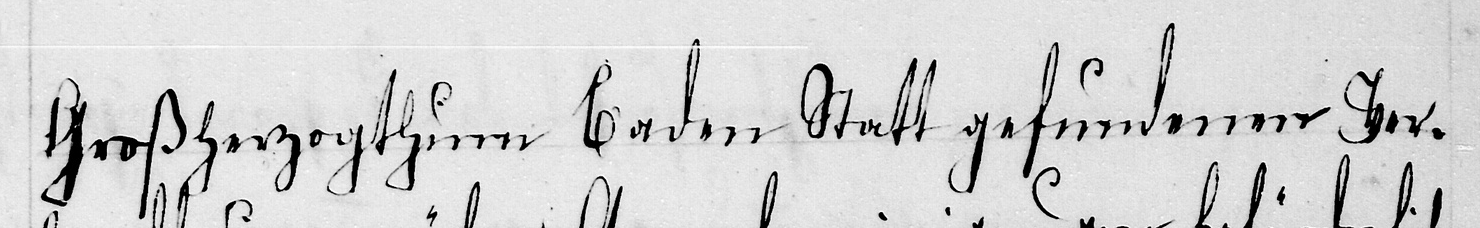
Großherzogthum Baden Statt gefundenen Ver¬
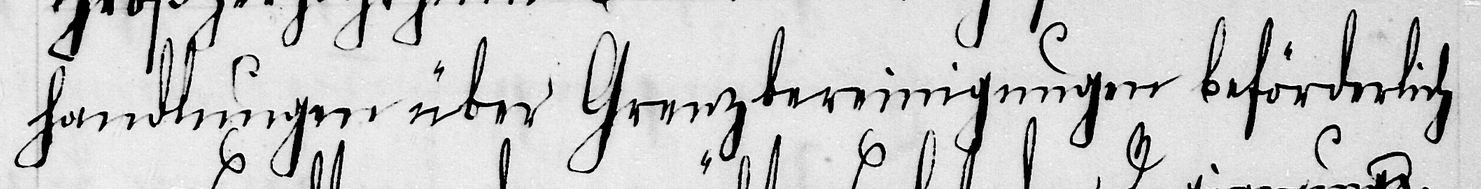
handlungen über Grenzbereinigungen beförderlich
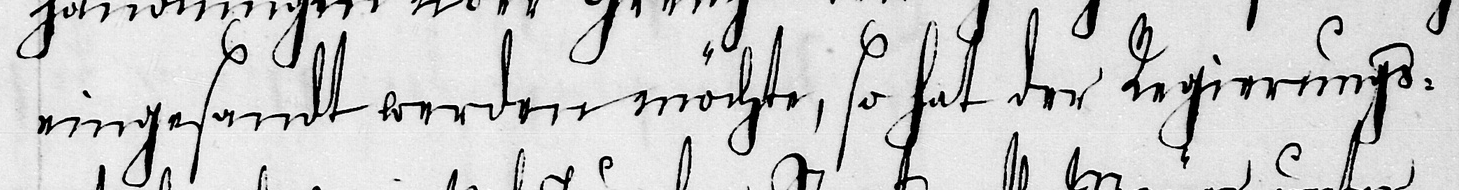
eingesandt werden möchte, so hat der Regierungs¬
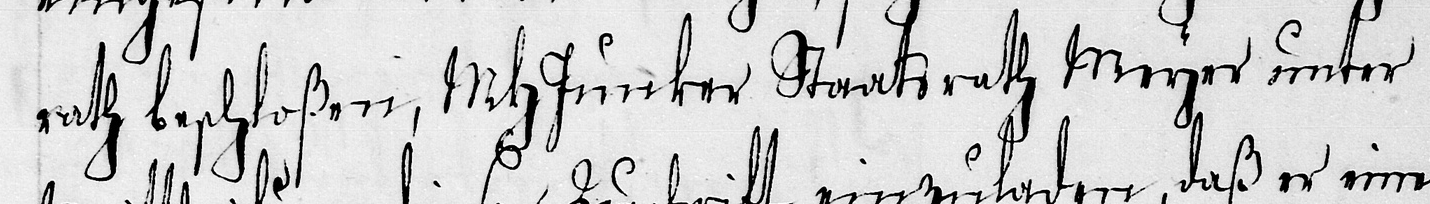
rath beschloßen, MHJunker Staatsrath Meyer unter
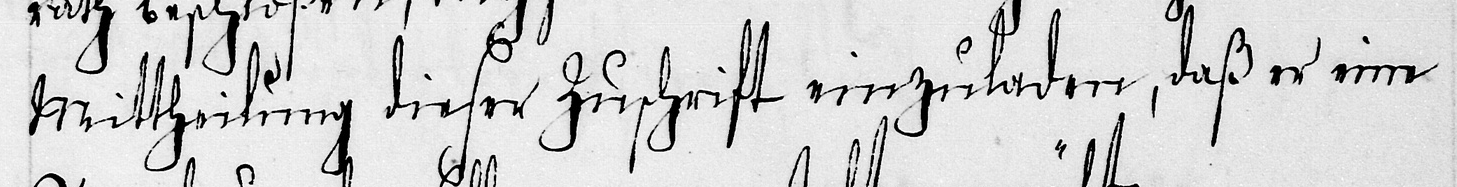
Mittheilung dieser Zuschrift einzuladen, daß er eine
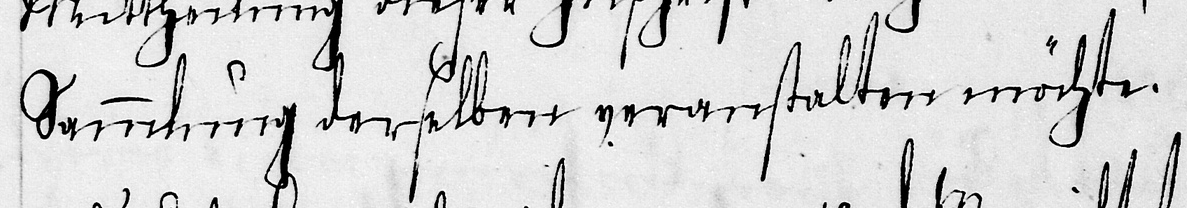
Sammlung derselben veranstalten möchte.
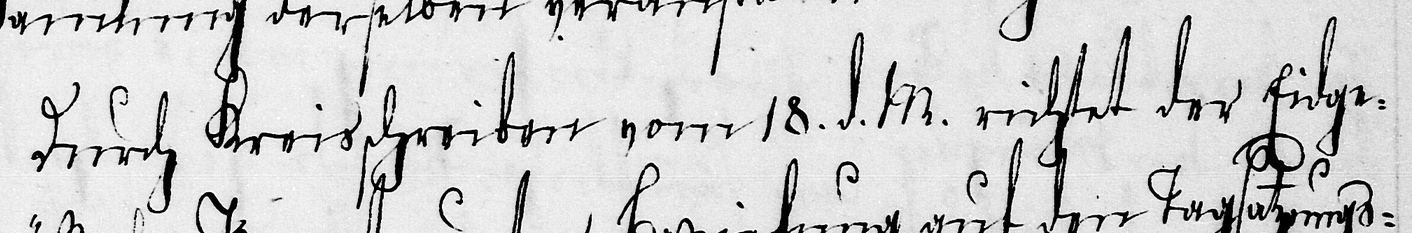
Durch Kreisschreiben vom 18. d. M. richtet der Eidge¬
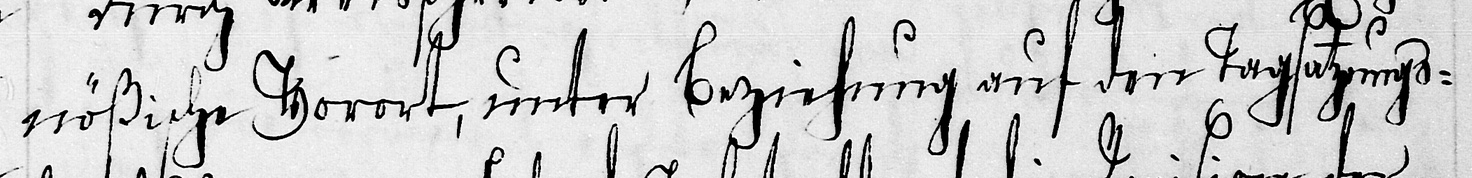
nößische Vorort, unter Beziehung auf den Tagsatzungs¬
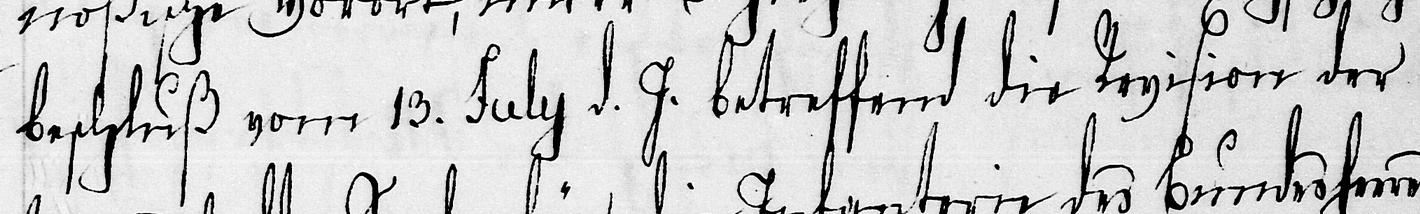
beschluß vom 13. July d. J. betreffend die Revision der
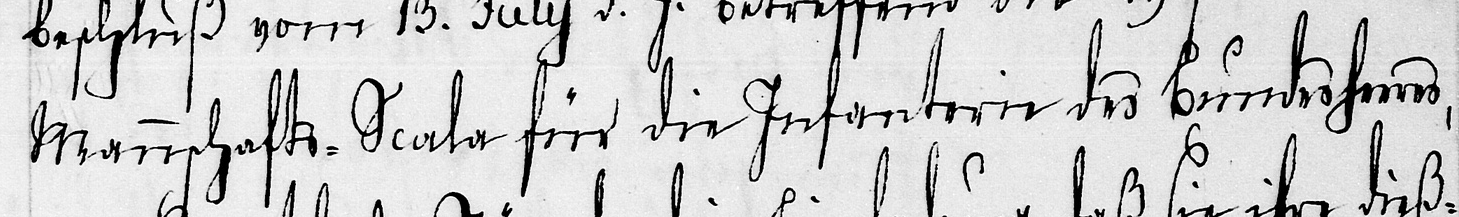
Mannschafts-Scala für die Infanterie des Bundeshee¬
